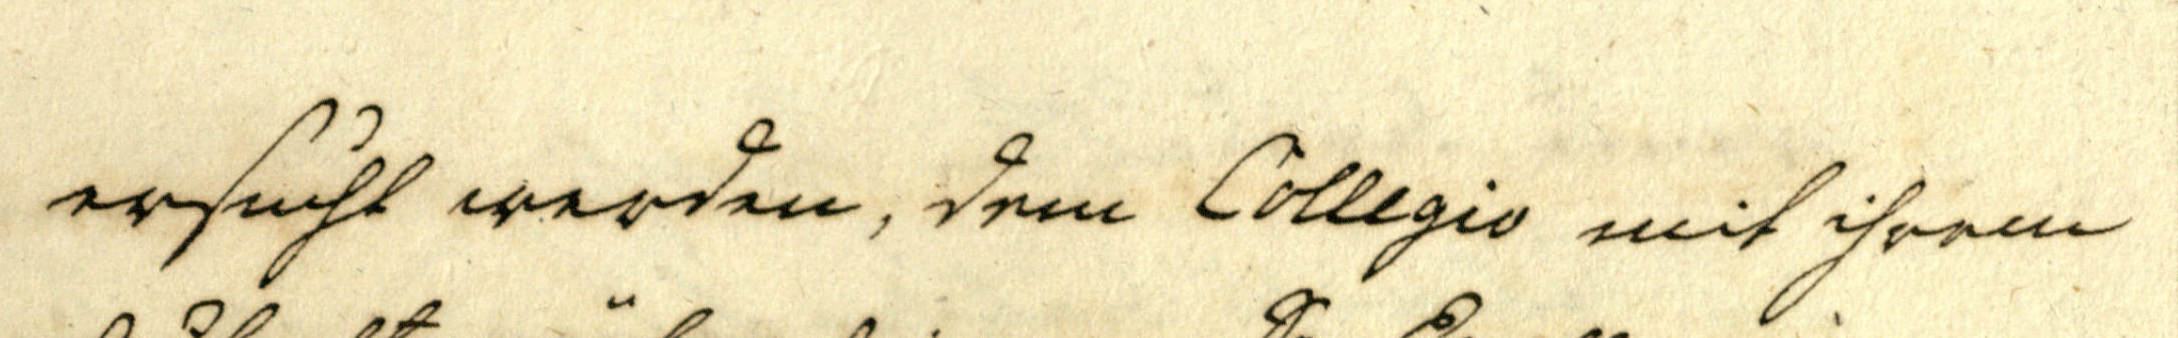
ersucht werden, dem Collegio mit ihrem
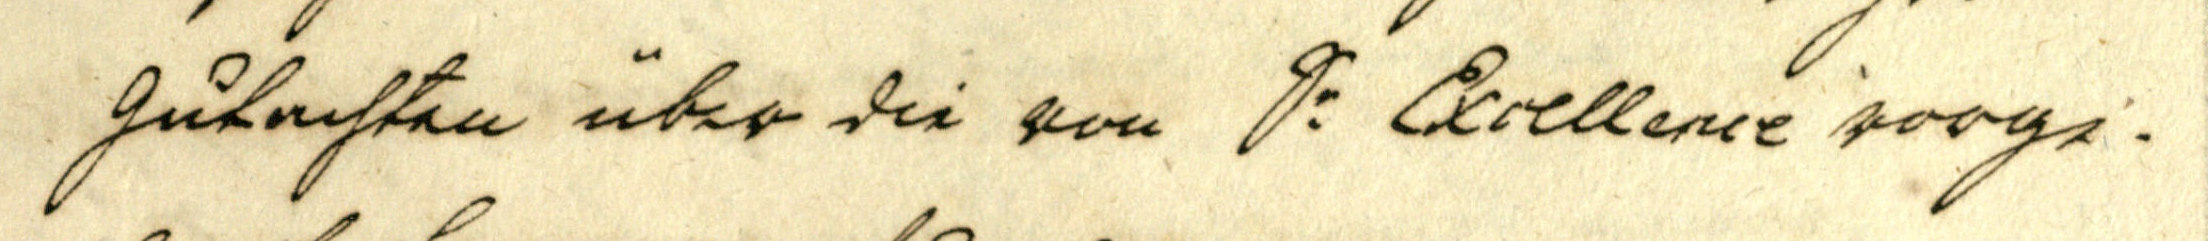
Gutachten über die von Sr Excellence vorge¬
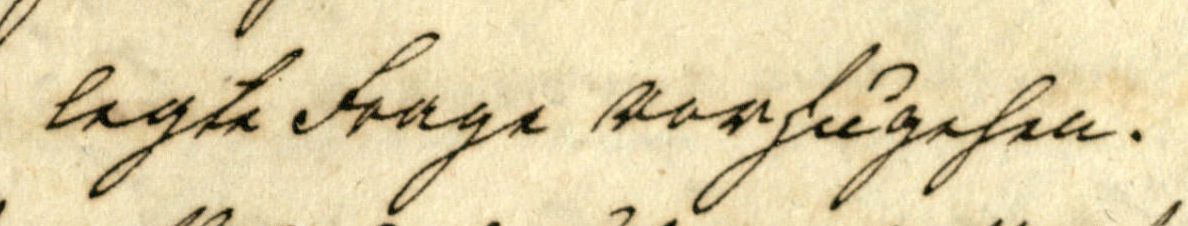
legte Frage vorzugehen.
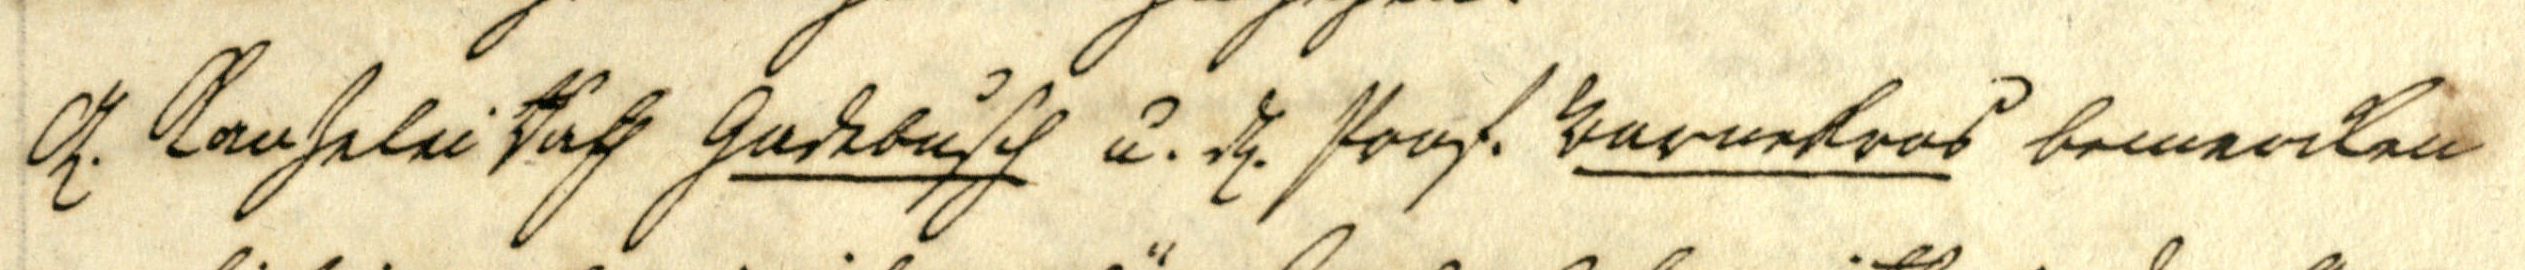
dh. Kanzelei Rath Gadebusch u. dh. Prof. Warnekros bemercken
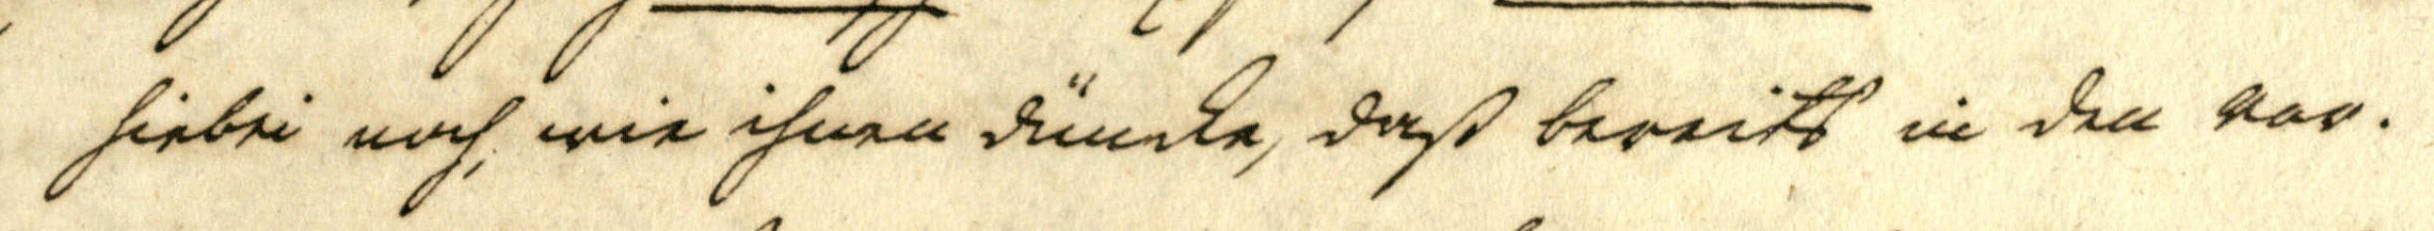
hiebei noch, wie ihnen düncke, daß bereits in den vor¬
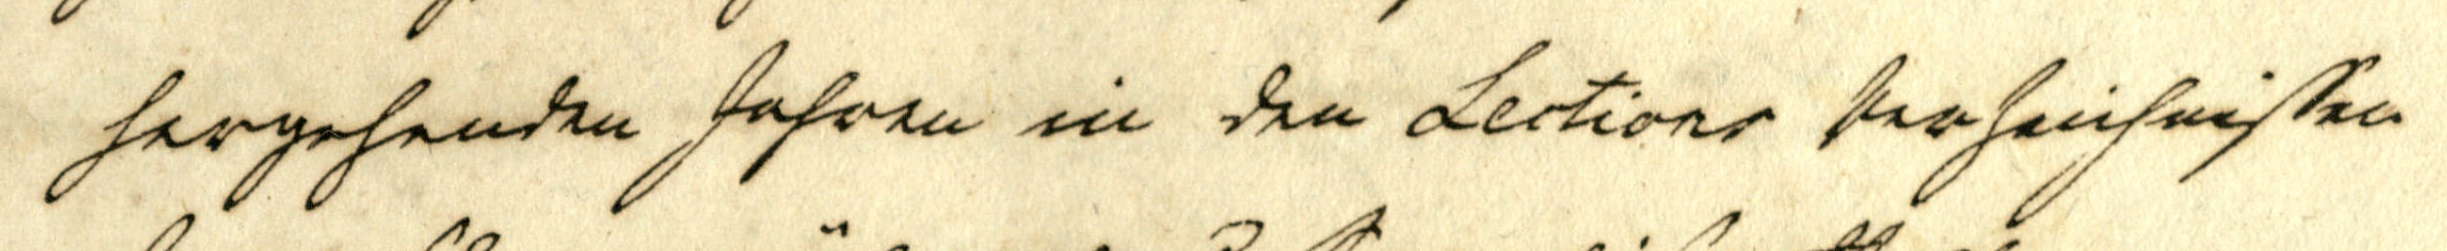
hergehenden Jahren in den Lections Verzeichnissen
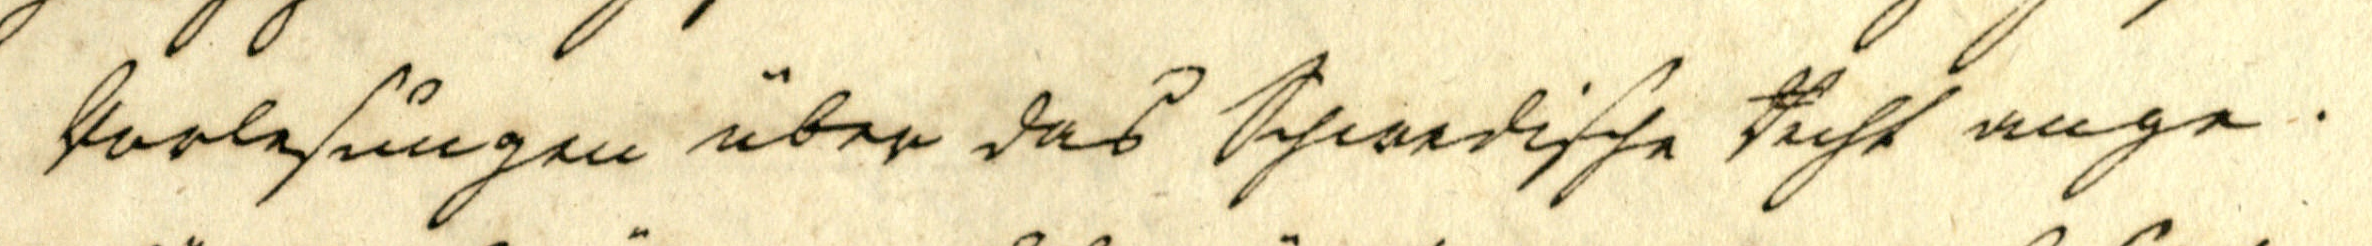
Vorlesungen über das Schwedische Recht ange¬
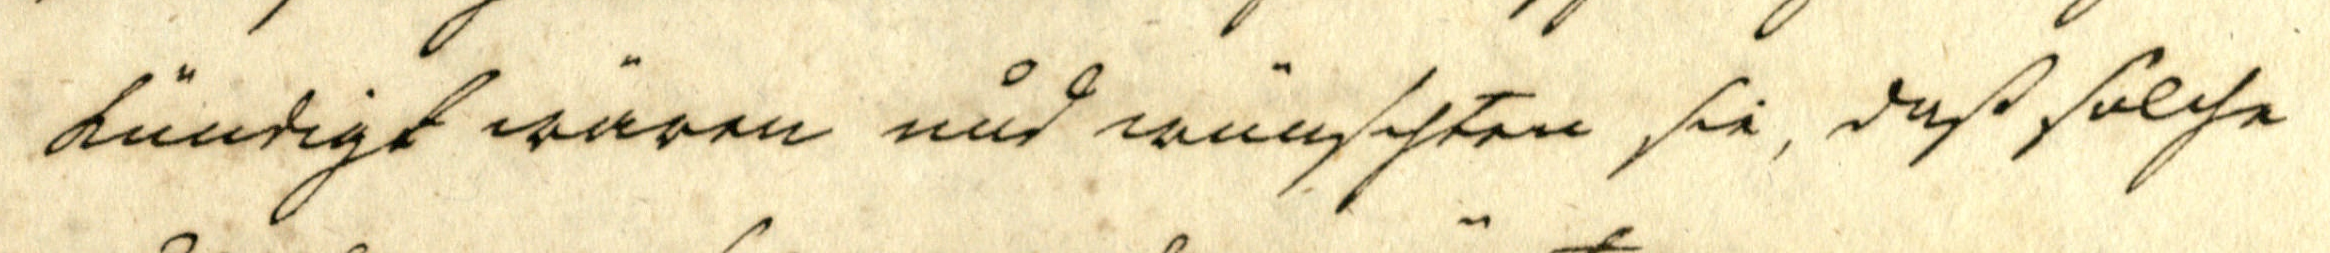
kündigt wären und wünschten sie, daß solche
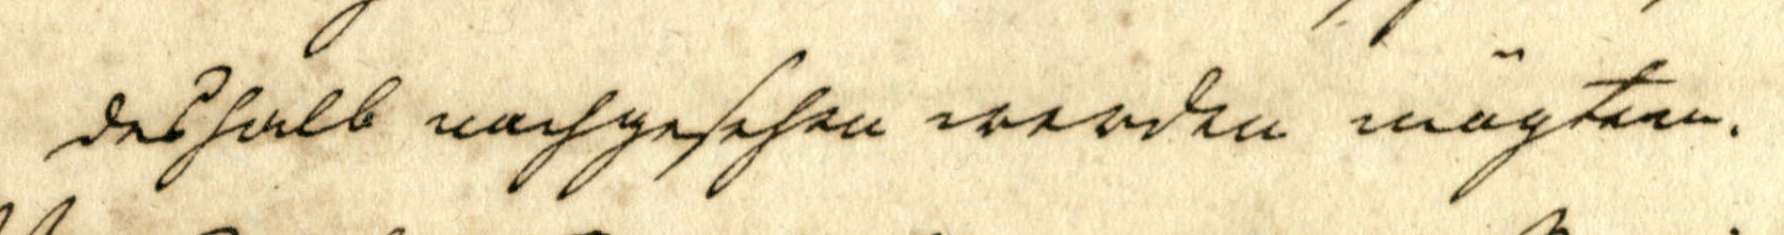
deshalb nachgesehen werden mögten.
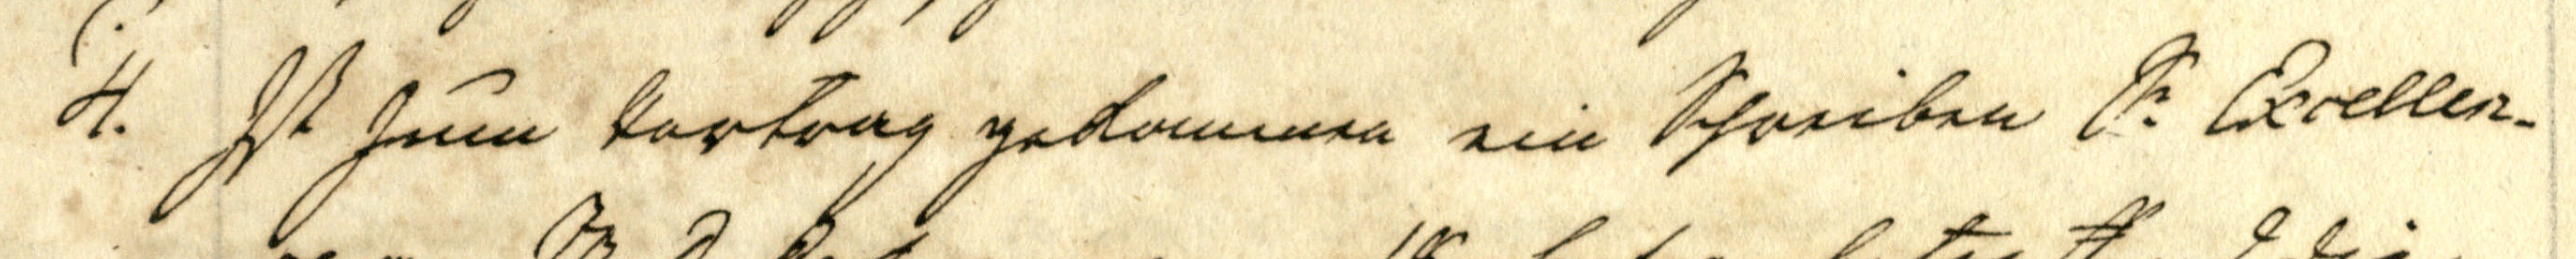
Ist zum Vortrag gekommen ein Schreiben Sr Excellen¬
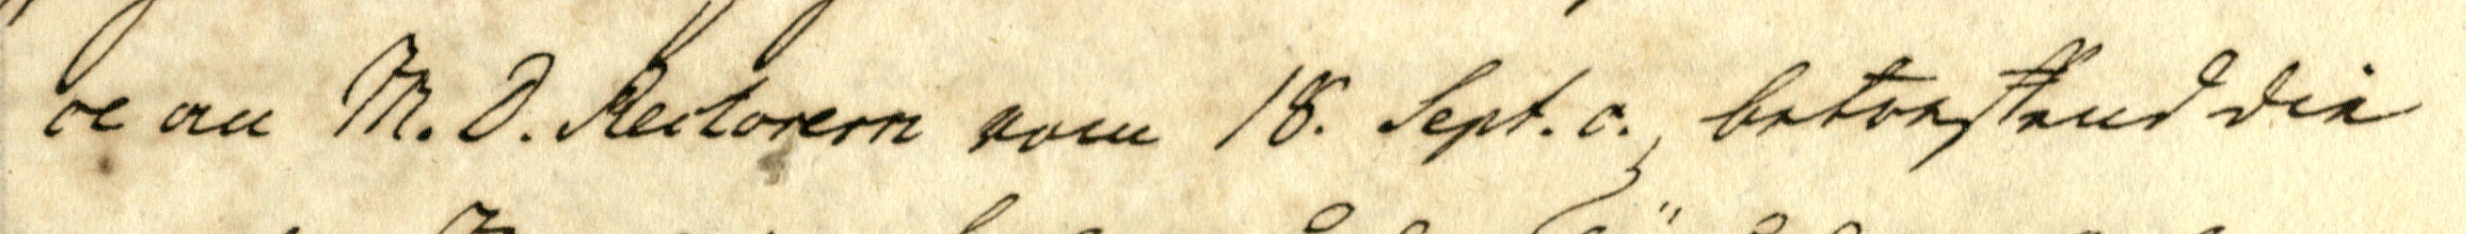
ce an M. D. Rectorem vom 18. Sept. c. betreffend die
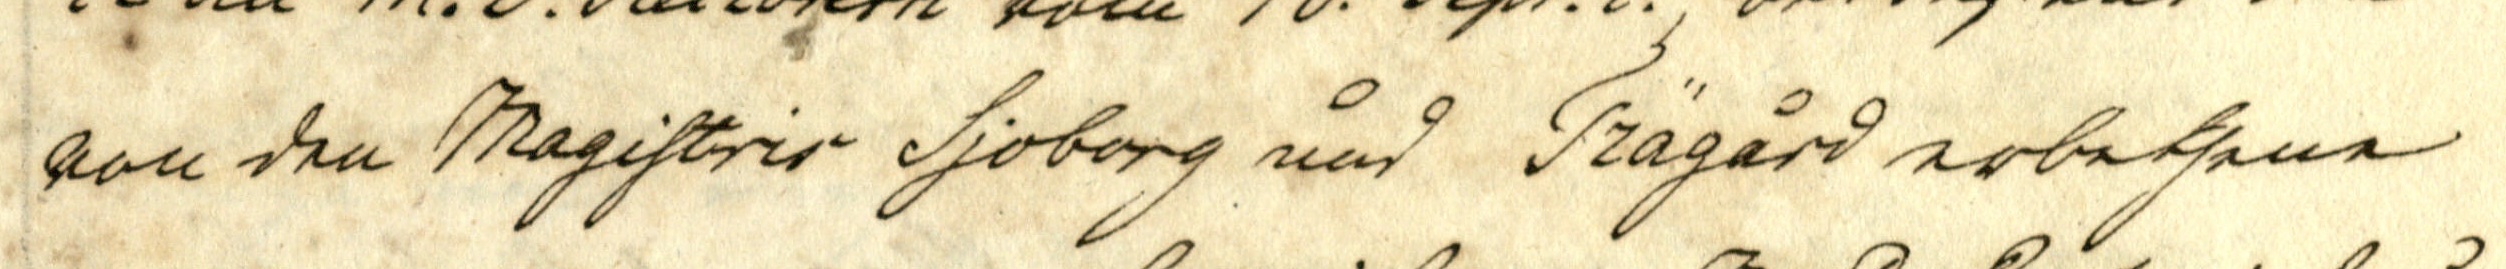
von den Magistris Sjoborg und Trägård erbethene
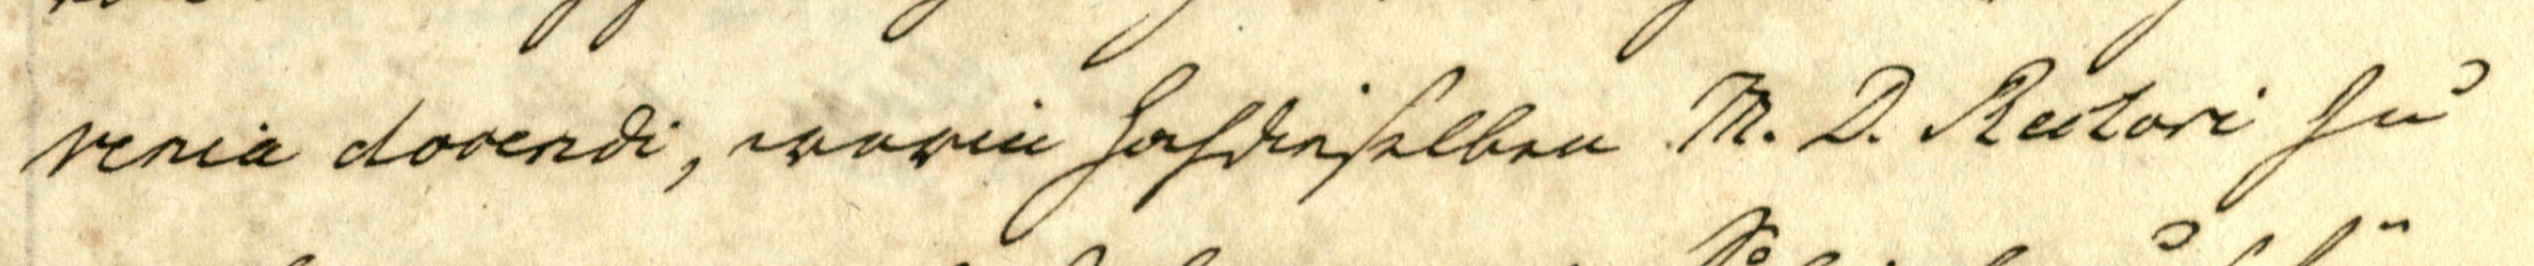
venia docendi, worin Hochdieselben M. D. Rectori zu
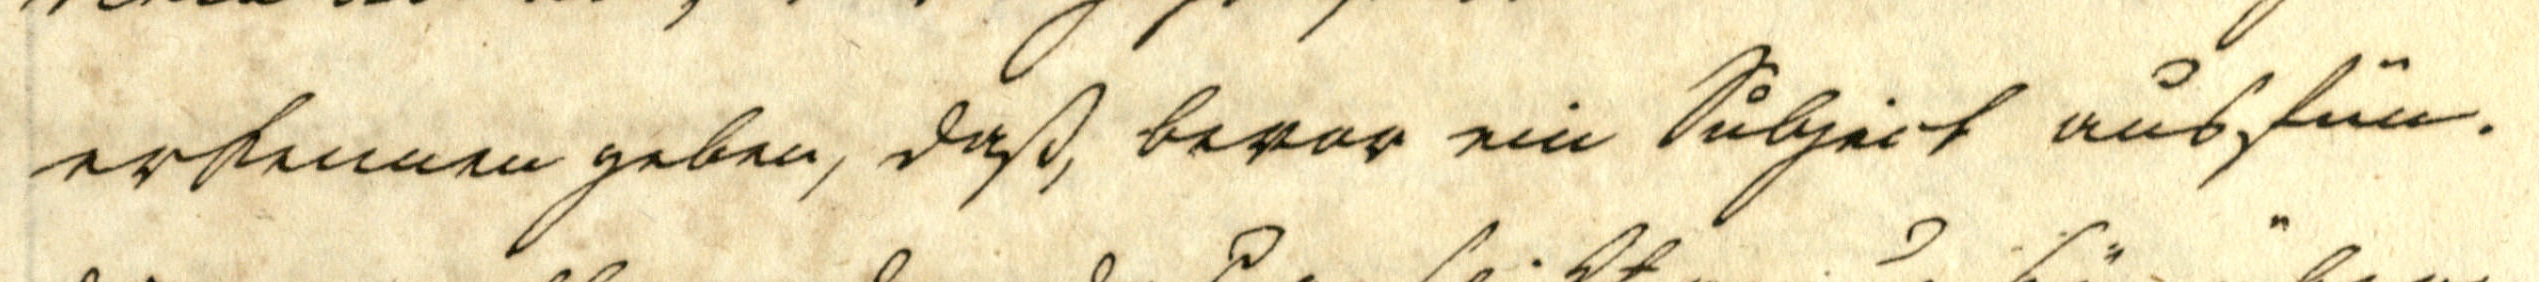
erkennen geben, daß, bevor ein Subject ausfün¬
